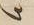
L.
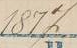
Altorf
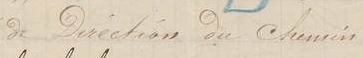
de Direction du chemin de
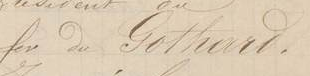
fer du Gothard.
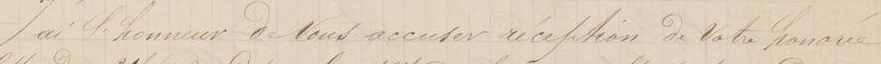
J'ai l'honneur de Vous accuser réception de Votre honorée
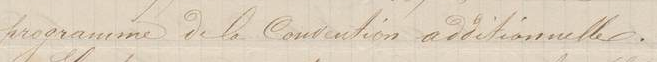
programme de la Convention additionelle.
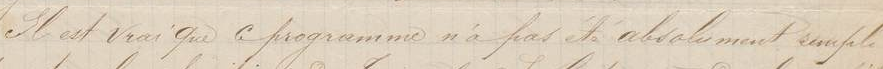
Il est vrai que le programme n'a pas été absolument rempli
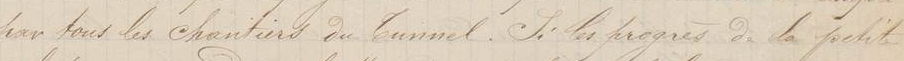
par tous les chantiers du tunnel. Si les progrès de la petite
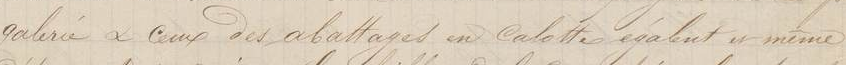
galerie & ceux des abattages en calotte égalent et même
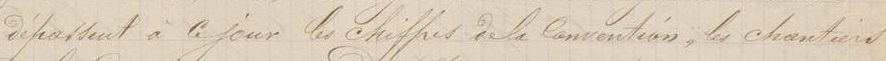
dépassent è ce jour les chiffres de la Convention, les chantiers
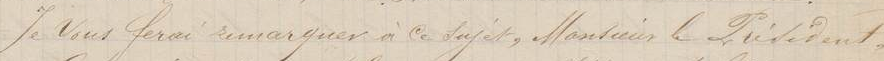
Je vous ferai remarquer à ce sujet, Monsieur le Président,
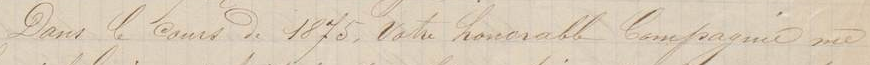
Dans le cours de 1875, votre honorable Compagnie me
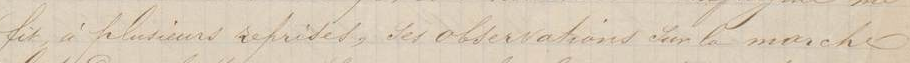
fit, à plusieurs reprises, ses observations sur la marche
